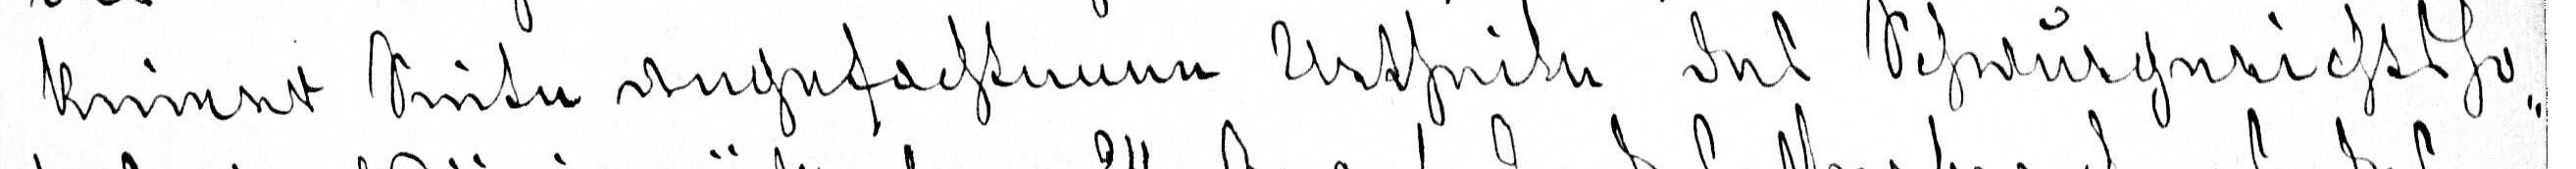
keiner Seite angefochtenen Urtheile des Schwurgerichtsho¬
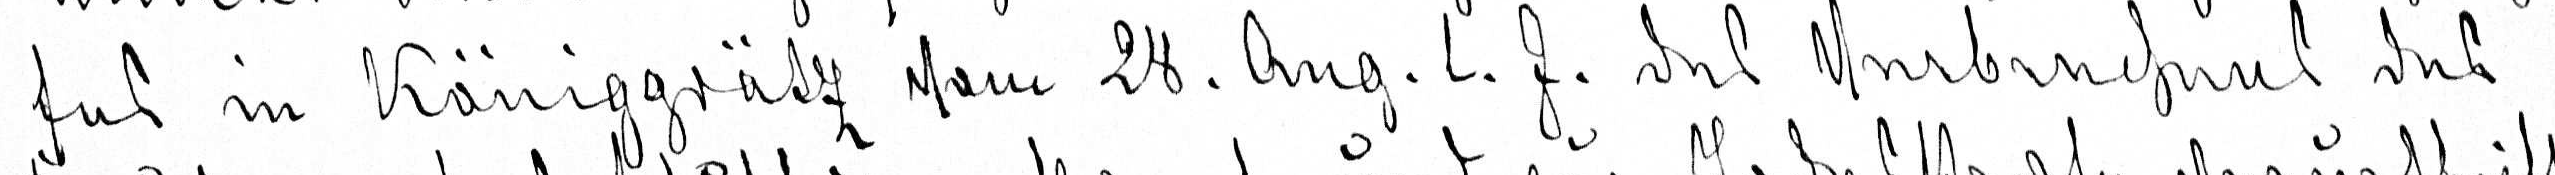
fes in Königgrätz vom 28. Aug. l. J. des Verbrechens des
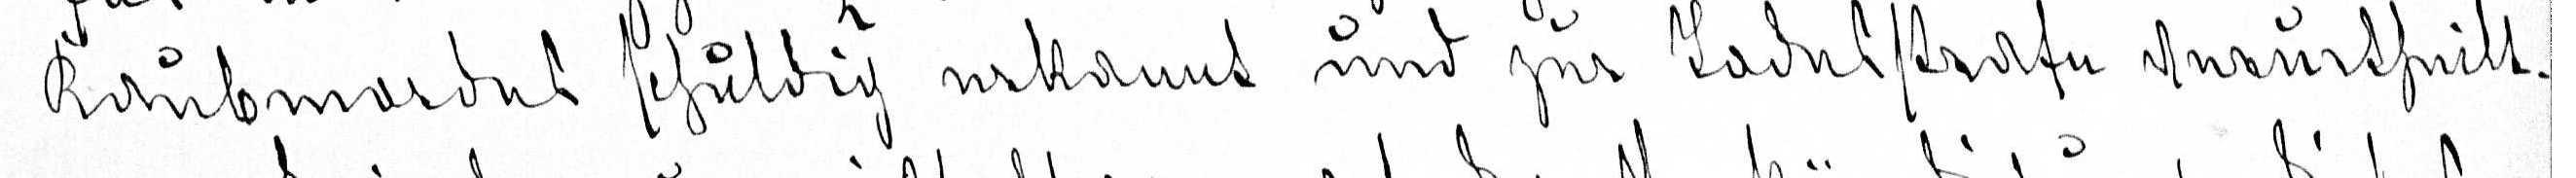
Raubmordes schuldig erkannt und zur Todesstrafe verurtheilt.
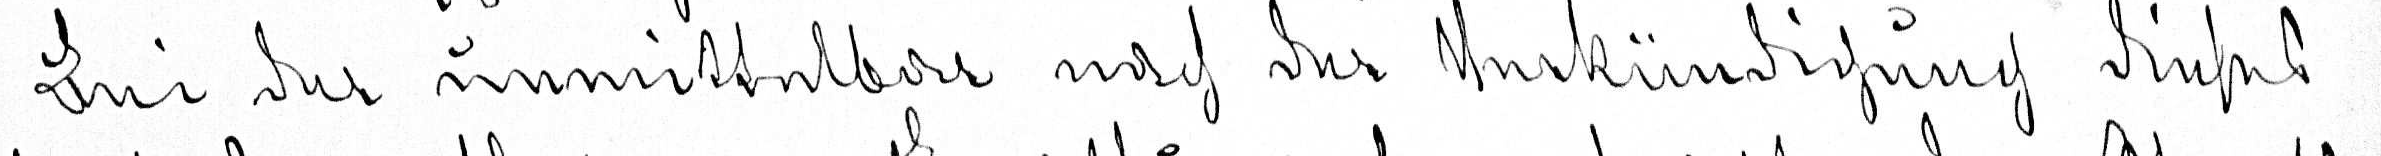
Bei der unmittelbar nach der Verkündigung dieses
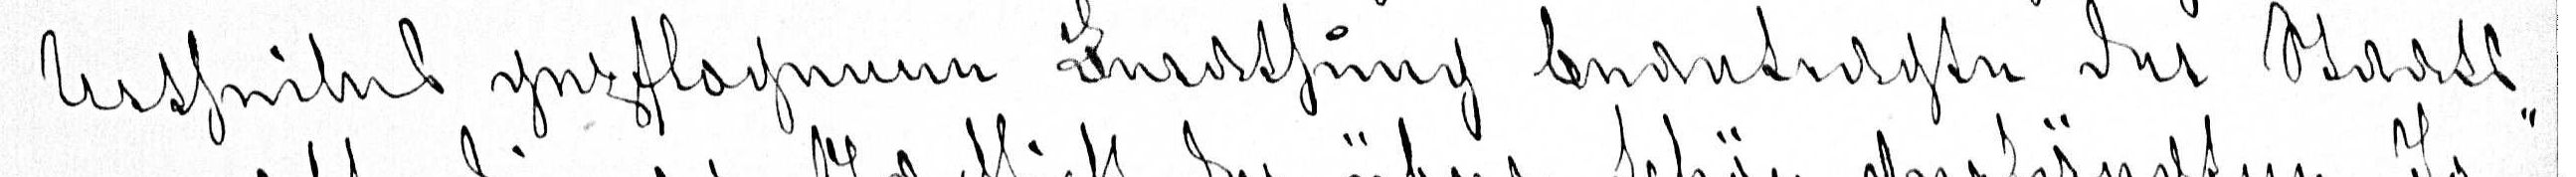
Urtheiles gepflogenen Berathung beantragte der Staats¬
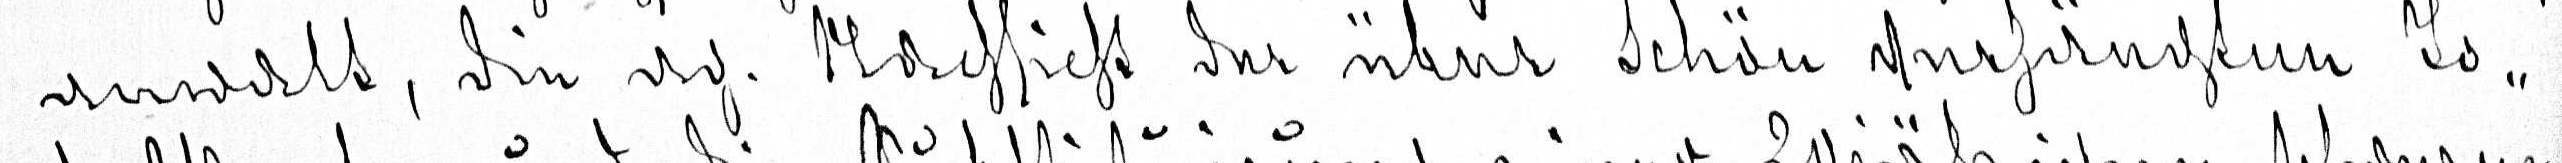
anwalt, die ag. Nachsicht der über Schön verhängten To¬
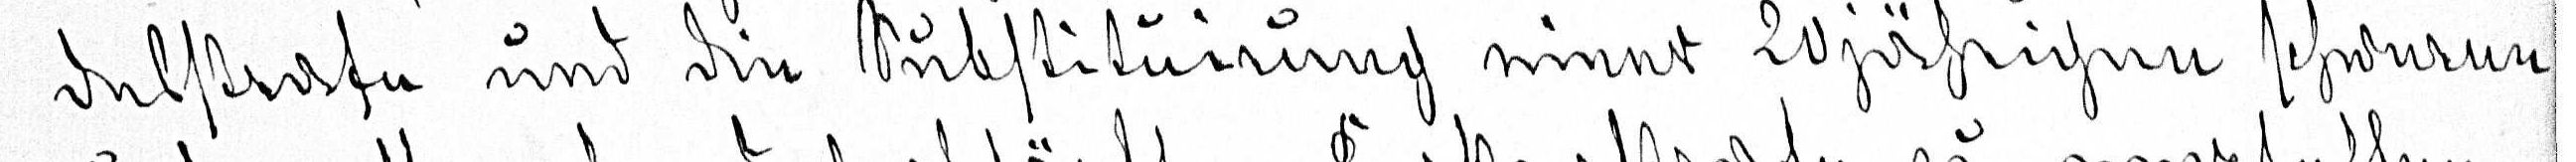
desstrafe und die Stubstituirung einer 20jährigen schweren
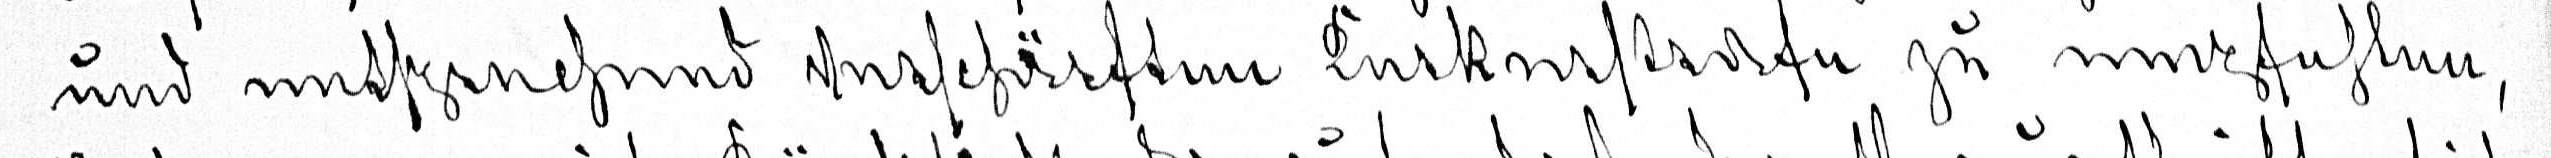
und entsprechend verschärften Kerkerstrafe zu empfehlen,
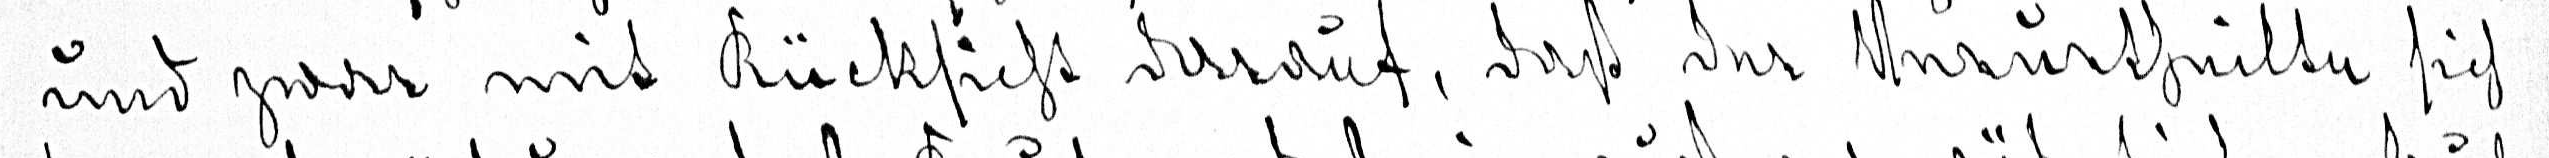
und zwar mit Rücksicht darauf, daß der Verurtheilte sich
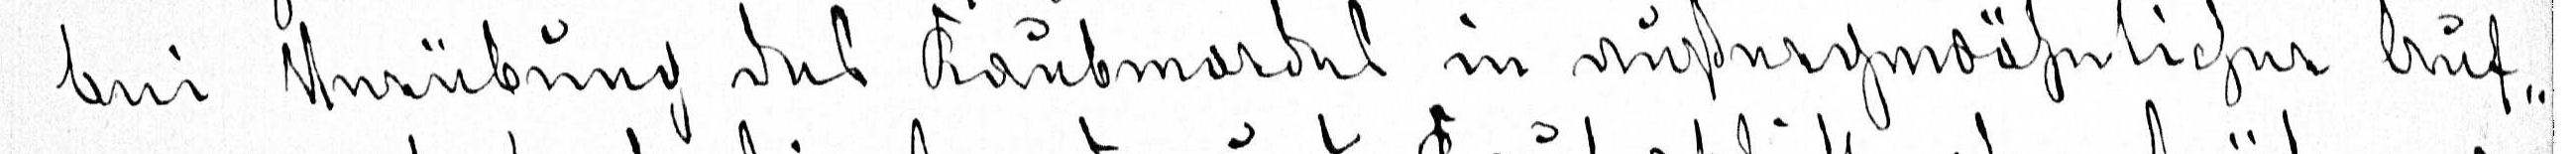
bei Verübung des Raubmordes in außergewöhnlichen Auf¬
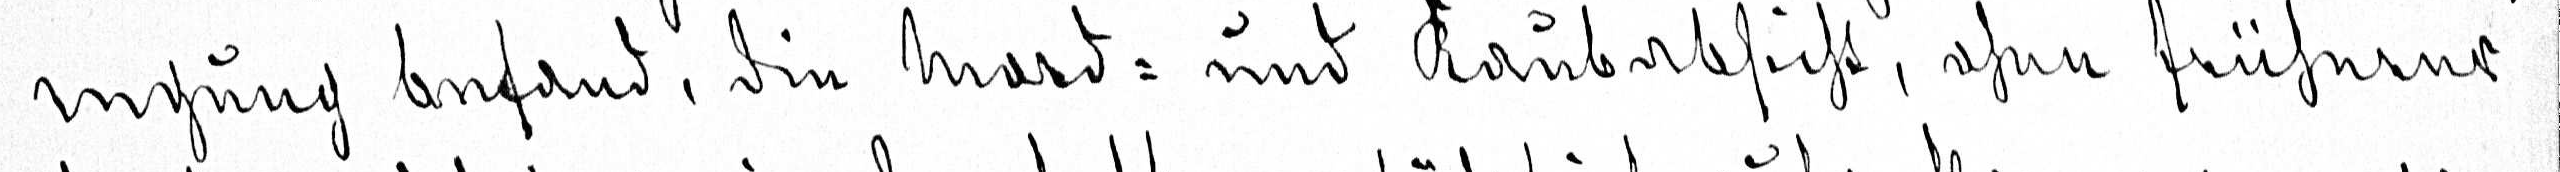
regung befand, die Mord- und Raubabsicht, ohne früherer
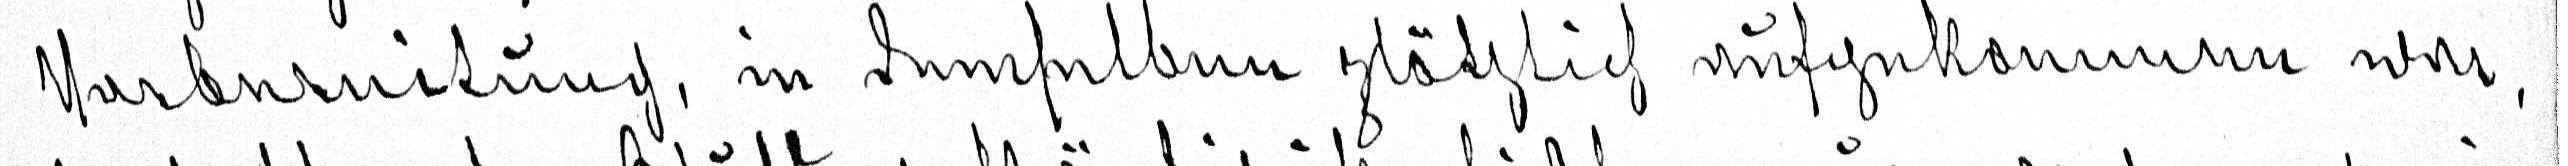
Vorbereitung, in demselben plötzlich aufgekommenen war,
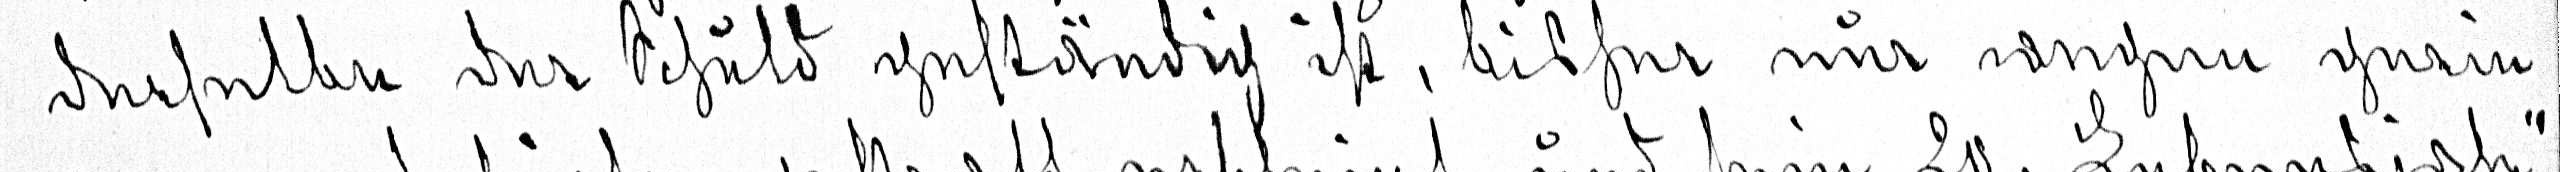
derselbe der Schuld geständig ist, bisher nur wegen gerin¬
